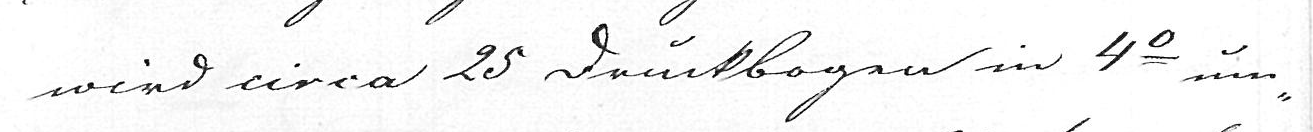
wird circa 25 Druckbogen im 4o um-
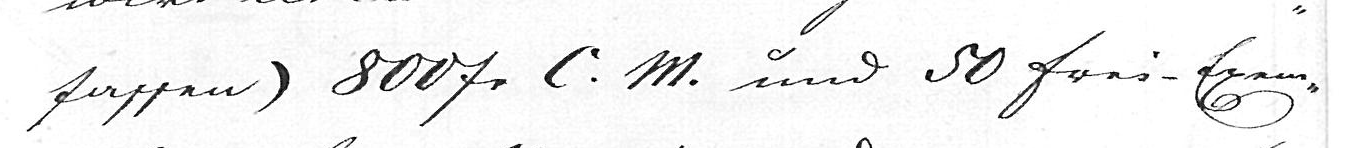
fassen) 800 fr C. M. und 50 Frei-Exem-
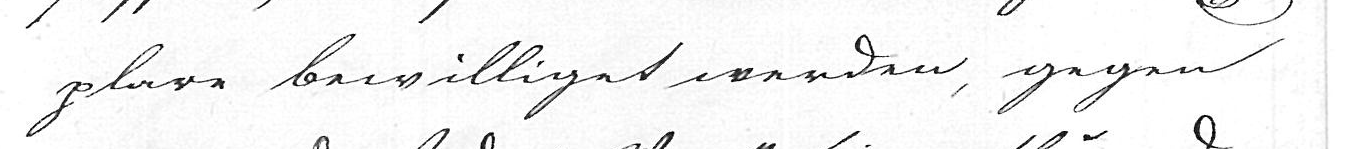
plare bewilliget werden, gegen
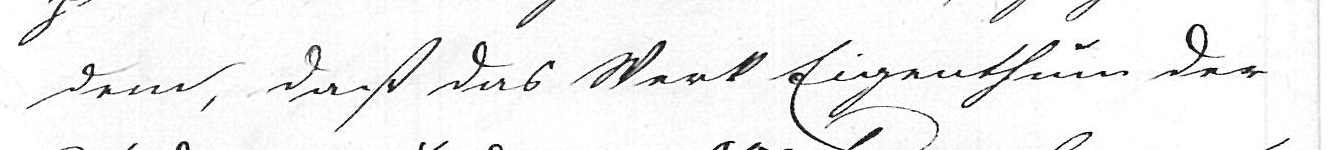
dem, daß das Werk Eigenthum der
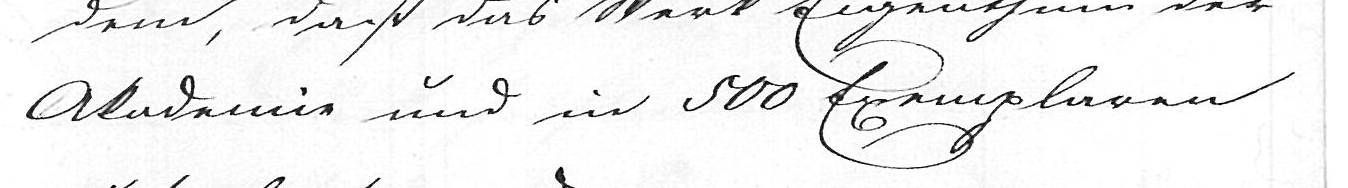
Akademie und in 500 Exemplaren
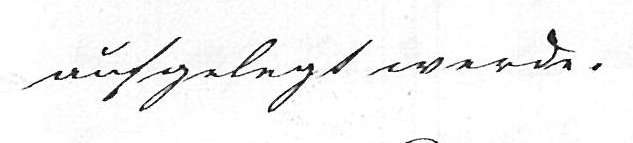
aufgelegt werde.
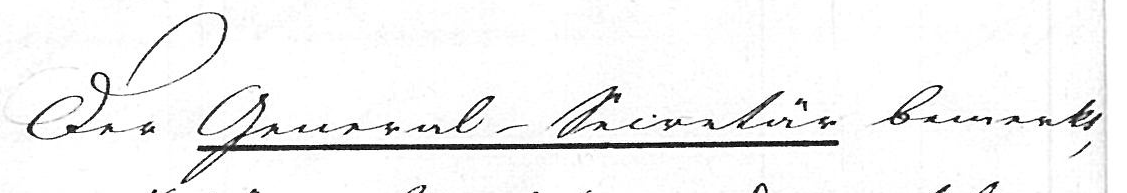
Der General-Secretär bemerkt,
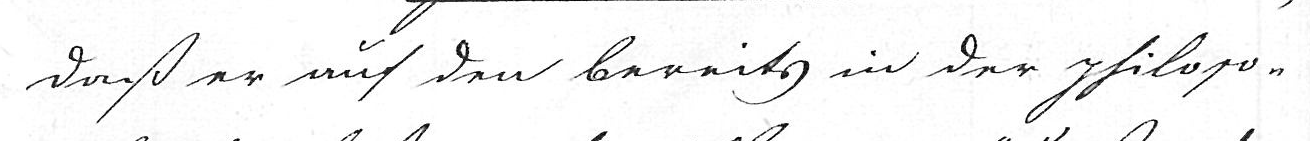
daß er auf den bereits in der philoso-
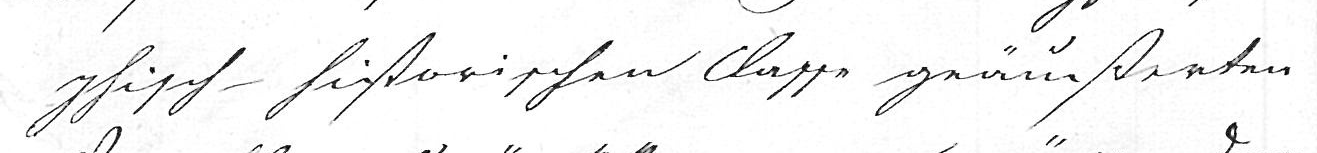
phisch-historischen Classe geäußerten
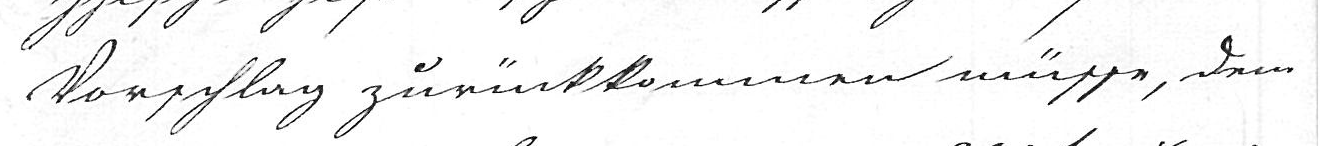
Vorschlag zurückkommen müsse, dem
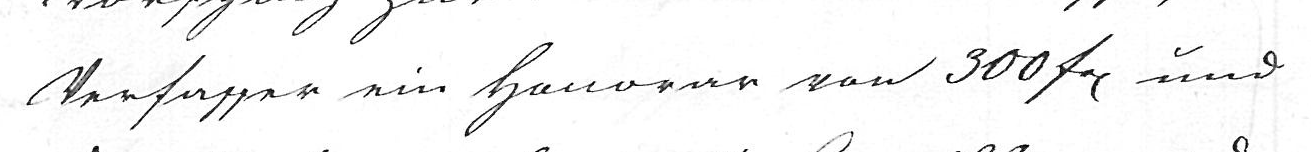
Verfasser ein Honorar von 300 fl und
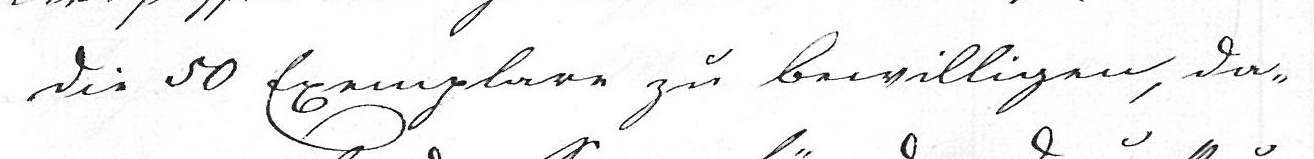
die 50 Exemplare zu bewilligen, da-
